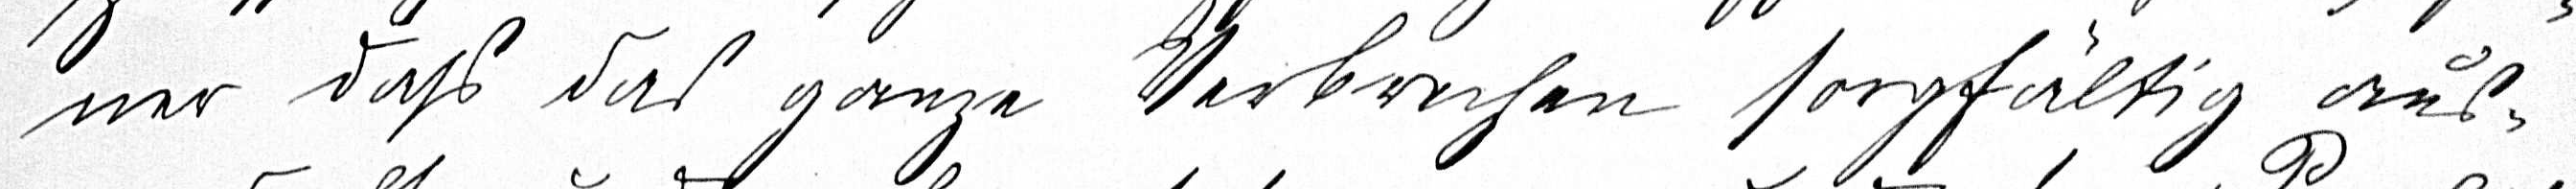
ner daß das ganze Verbrechen sorgfältig aus¬
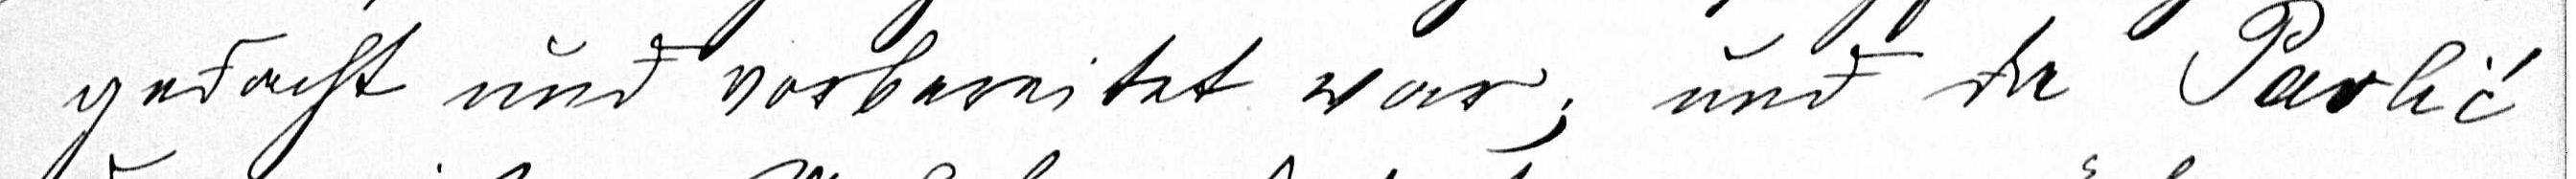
gedacht und vorbereitet war, und da Pavlić
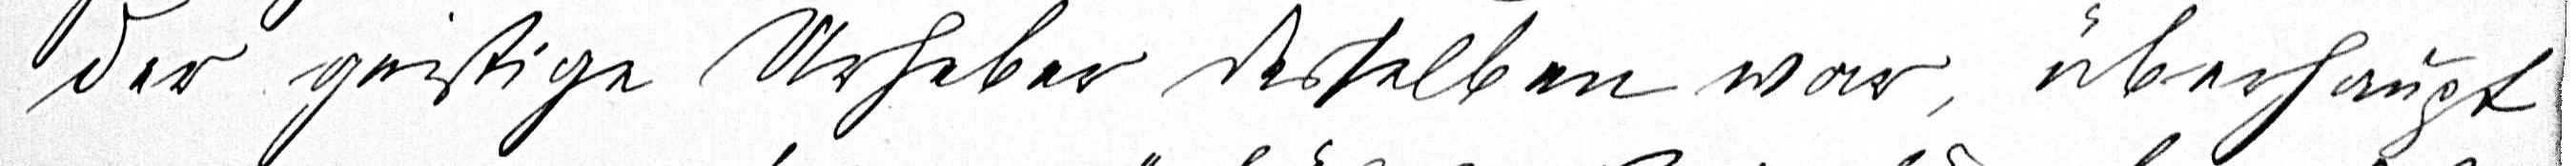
der geistige Urheber desselben war, überhaupt
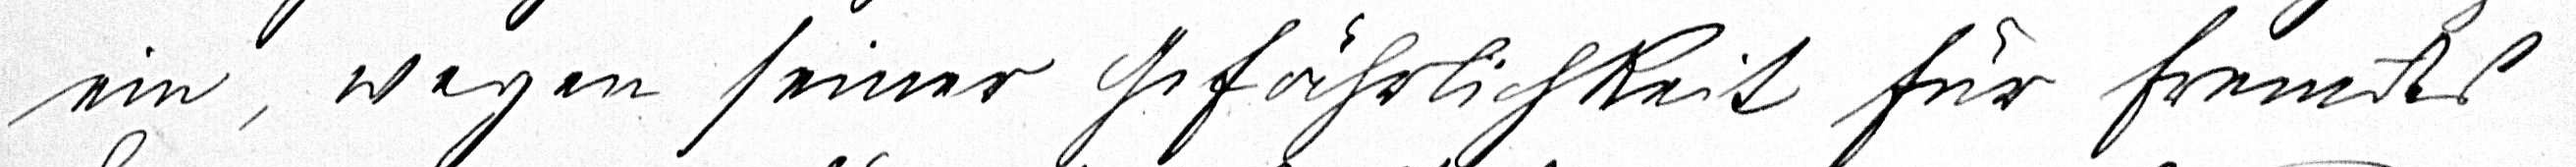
ein, wegen seiner Gefährlichkeit für fremdes
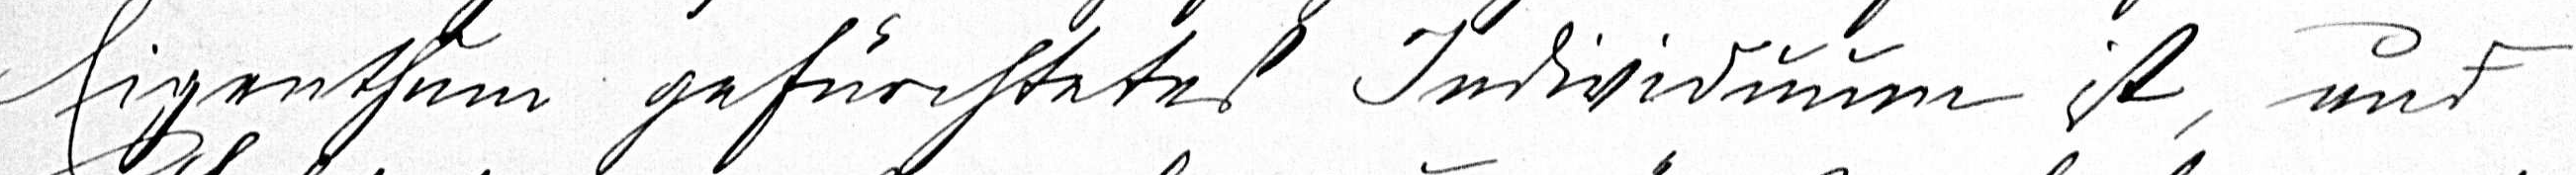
Eigenthum gefürchtetes Individuum ist, und
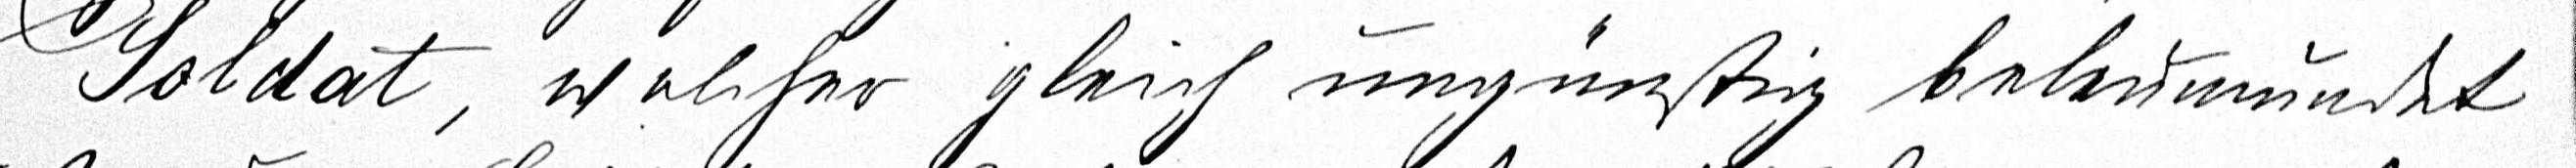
Soldat, welcher gleich ungünstig beleumundet
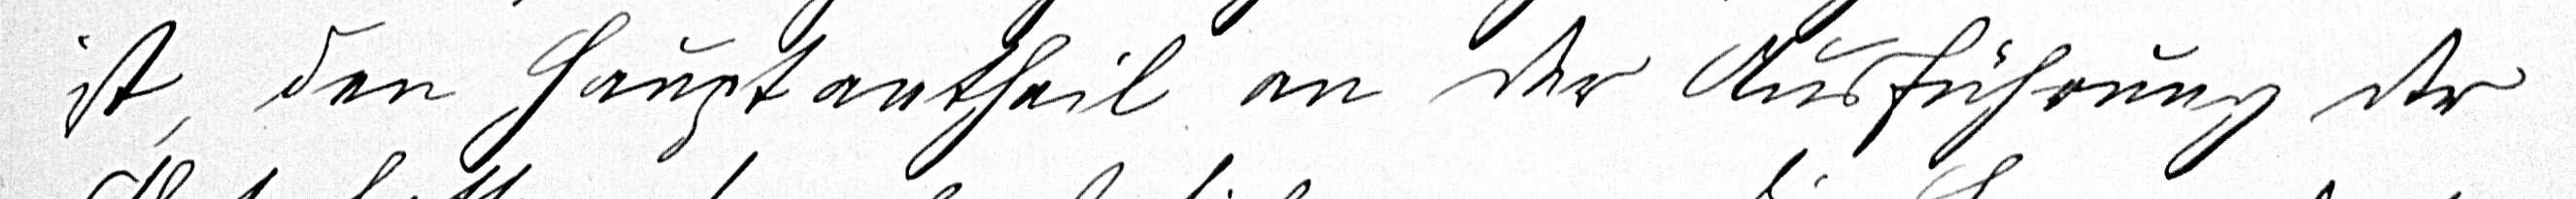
ist, den Hauptantheil an der Ausfürhung er
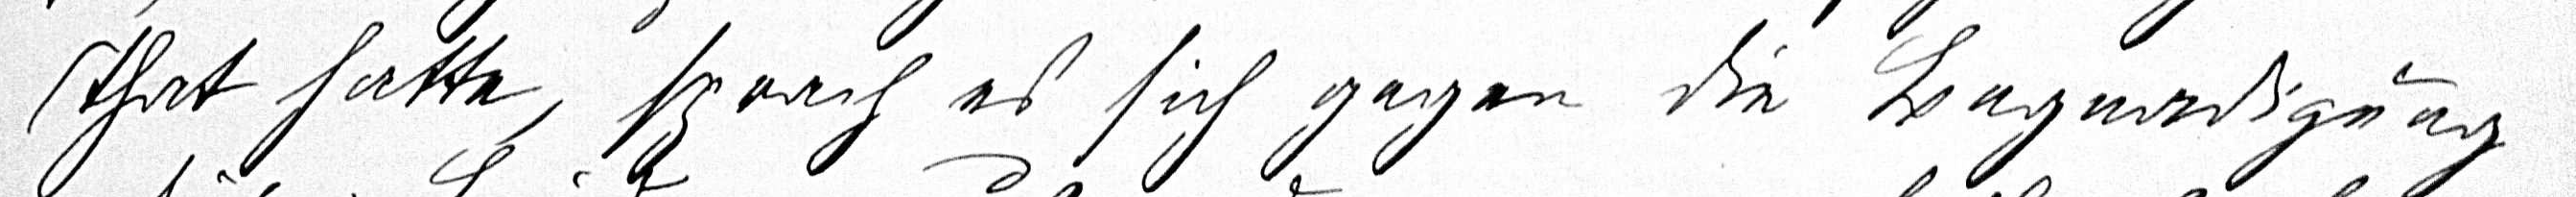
That hatte, sprach es sich gegen die Begnadigung
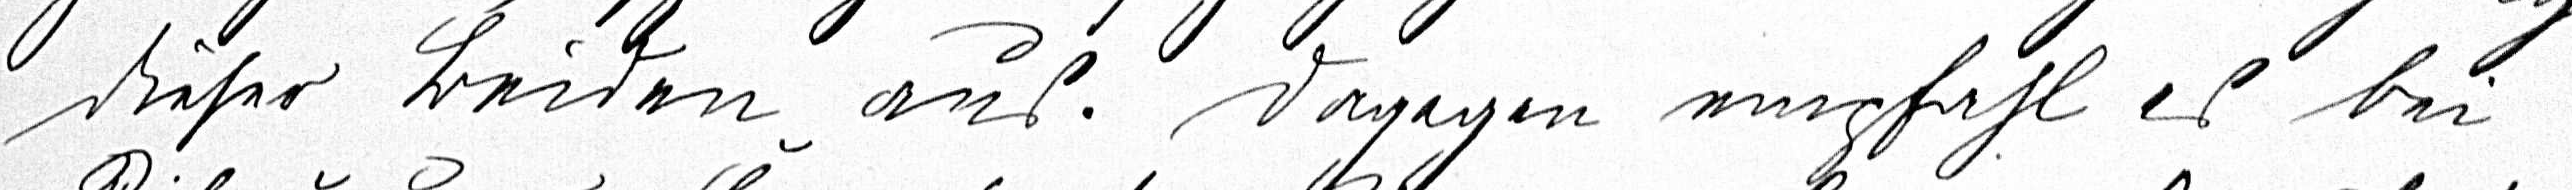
dieser Beiden aus. Dagegen empfahl es bei
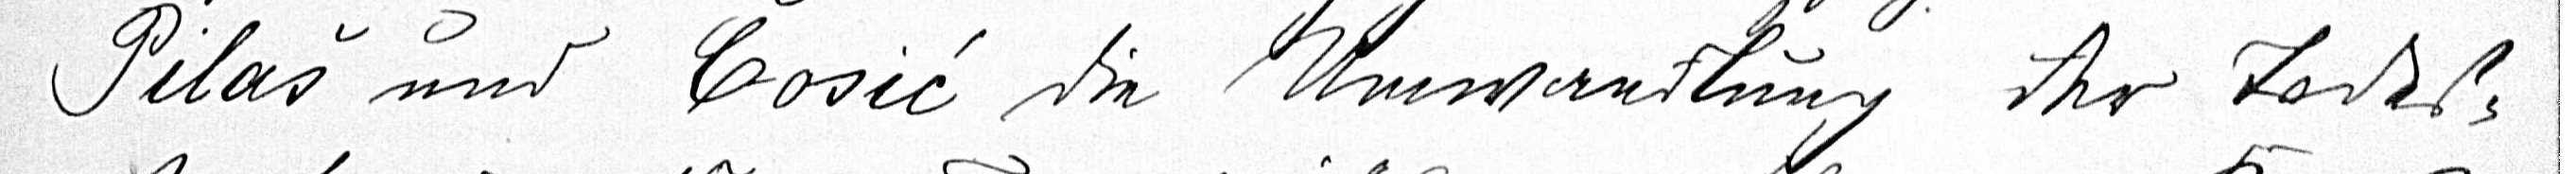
Pilaš und Čošić die Unwandlung der Todes¬
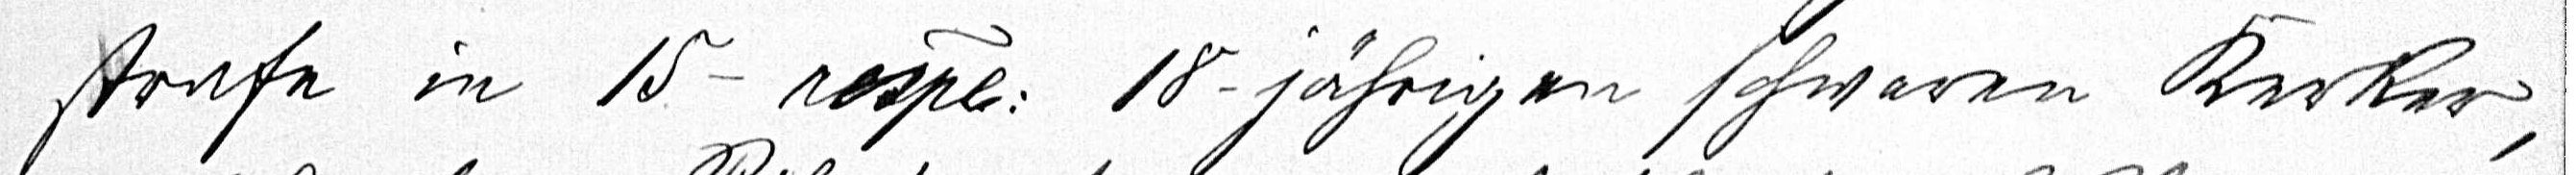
strafe in 15-respe. 18-jährigen schweren Kerker,
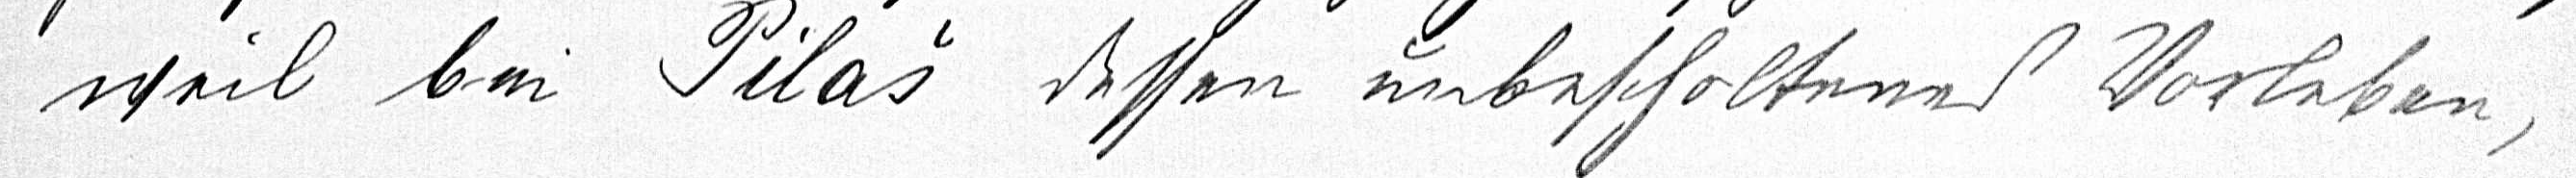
weil bei Pilaš dessen unbescholtenes Vorleben,
